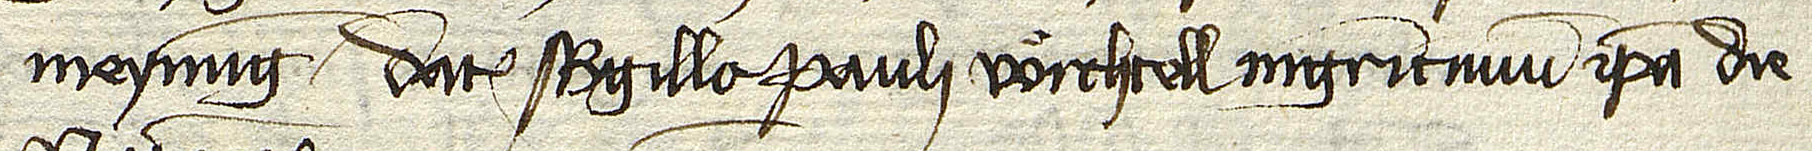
meynug* / Dat* ſ*gillo Pauli vörchtell mgriciuiu* ipa* die
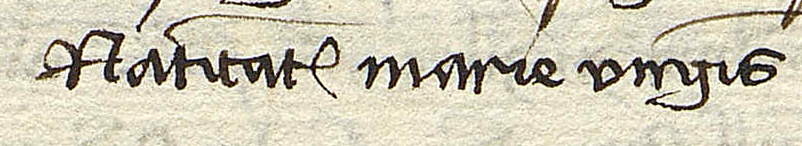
Natitat* marie virgis*
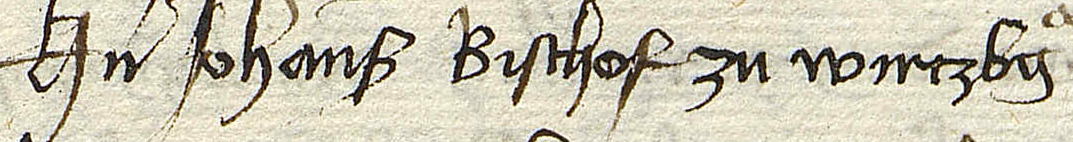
Hn* Iohanſ* Biſchof ʒu wircʒbg*
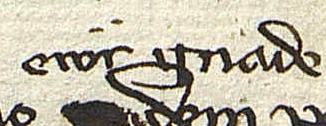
ewr gnade
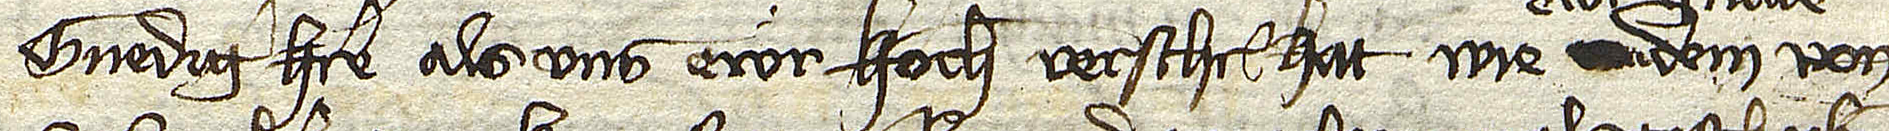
Gnedig* hre* als vns eẅr Hoch* verſchr* hat wie dem von
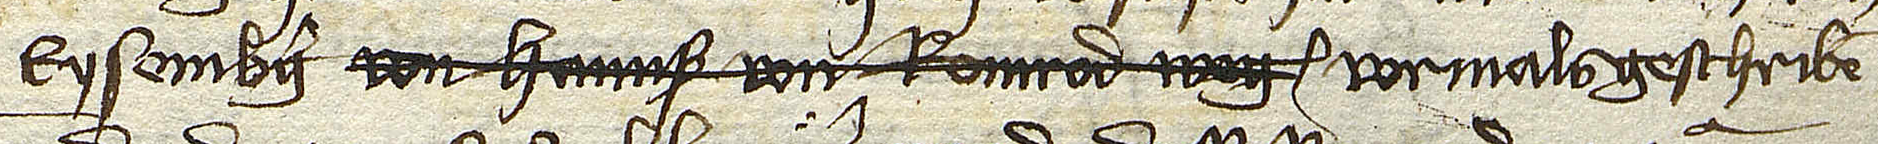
Eyſembg* von hannſ* von Romrod weg* vormals geſchribe*
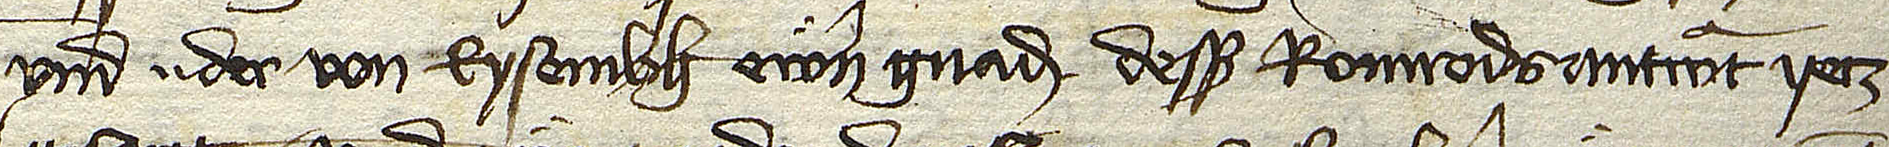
vnd ~ der von Eyſembg* ewn* gnad* deſſ* Romrods antwt* yecʒ
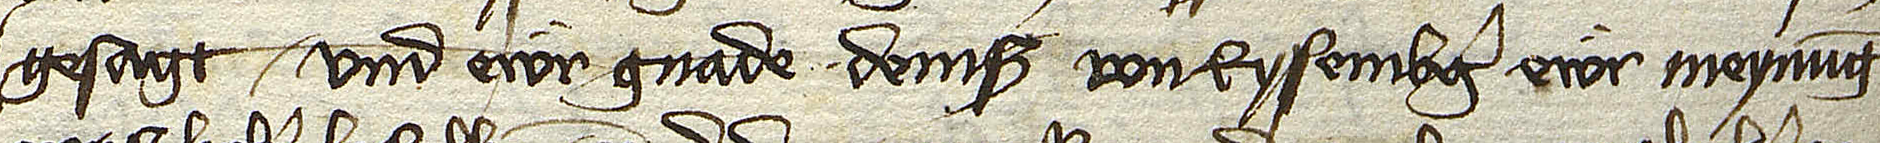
geſagt / vnd eẅr gnade . demſ* von Eyſembg* eẅr meynug*
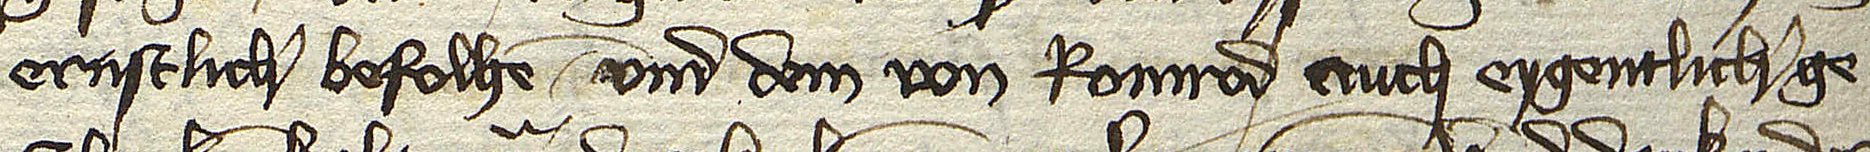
ernſtlich* befolhe* / vnd dem von Romrod auch eygentlich* ge
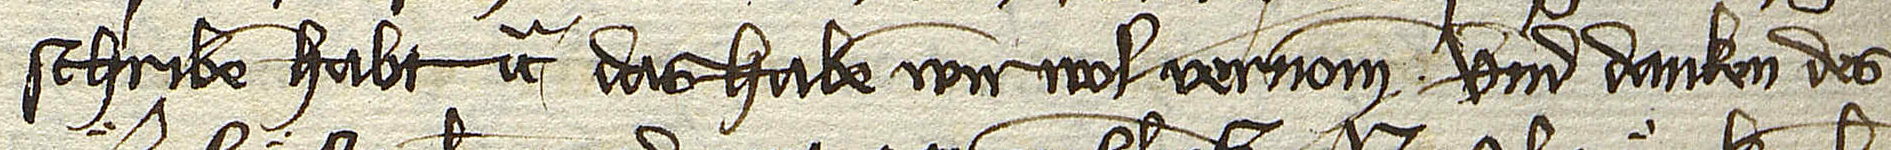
ſchribe* habt ec* das habe* wir wol vernom* . Vnd danken des
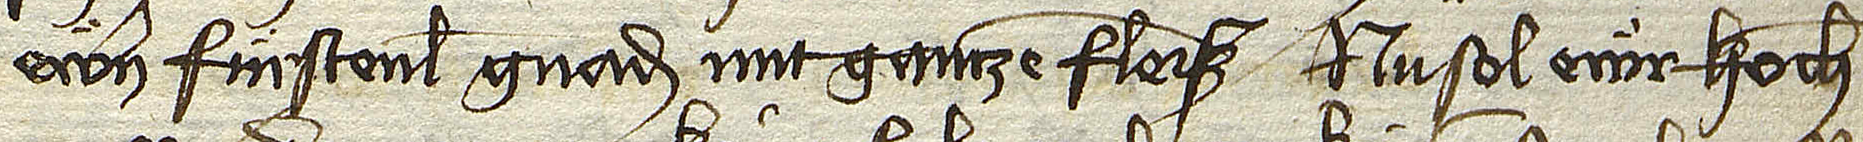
eẅn* fürſtenl* gnad* mit gancʒe* fleiſʒ / Nu sol eẅr hoch*
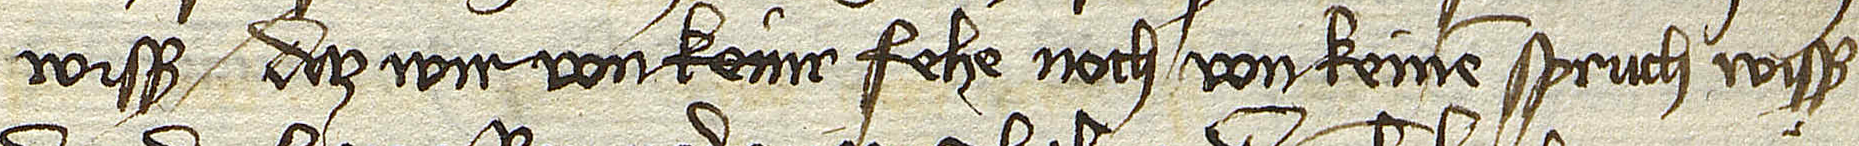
wiſſ* / daʒ wir von keinr fehe noch von keine* ſpruch wiſſ*
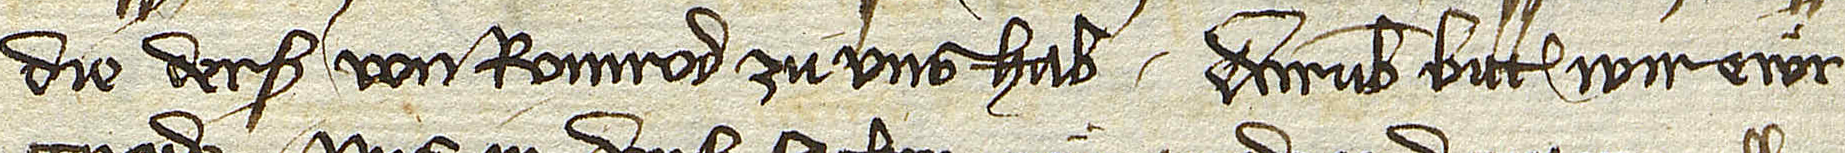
die derſ* von Romrod ʒu vns hab / Darub* bitt* wir eẅr*
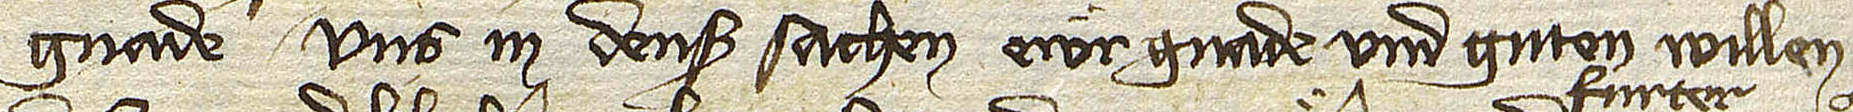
gnade / vns in denſ* ſachen ewr* gnade vnd guten willen
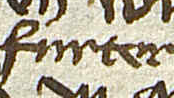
fürter
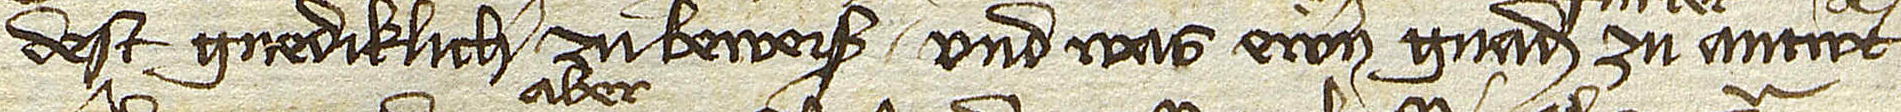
deſt gnediklich* ʒu beweiſ* / vnd was ewr* gnad* ʒu antwt*
